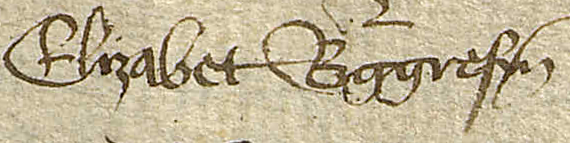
Eliʒabet B*ggrefin
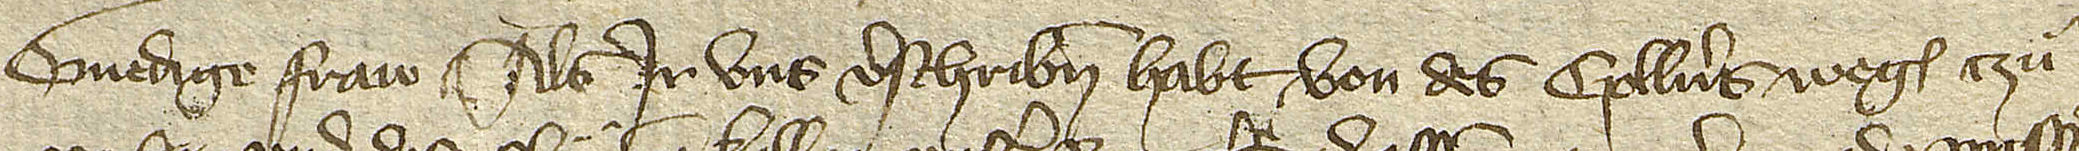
Gnedige fraw / Als Ir vns v*ſchribn* habt / von des Cʒolln*s weg* cʒü
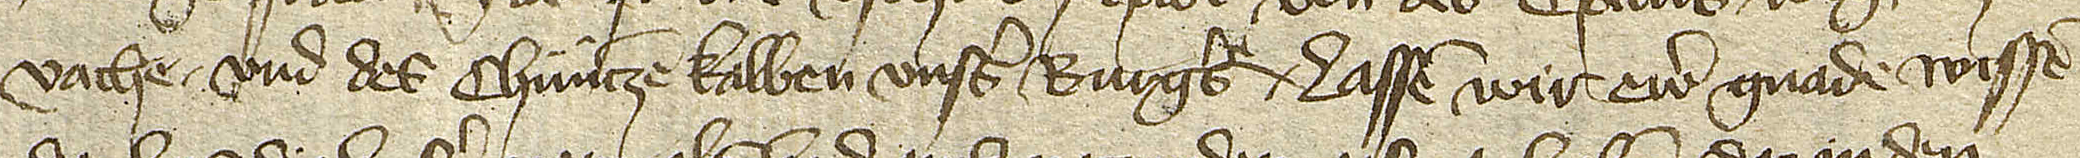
vache / vnd des Chüncʒe* kalben vnſ*s Burgs* / Laſſe* wir ew* gnade wiſſe*
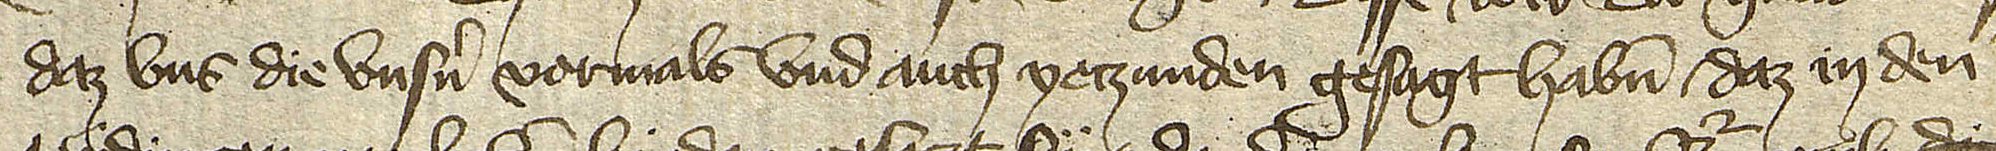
daʒ vns die vnſn* vormals vns auch yecʒunden geſagt habn* / daʒ in den
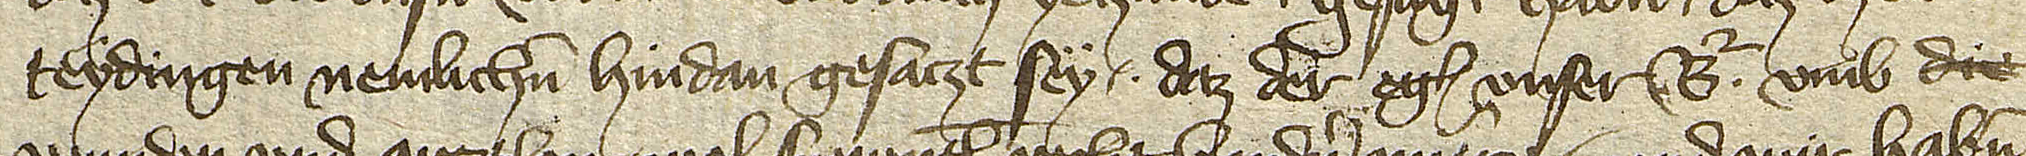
teydingen nemlichn* hindan geſacʒt ſey / . daʒ der eg* vnſer B*. vmb die
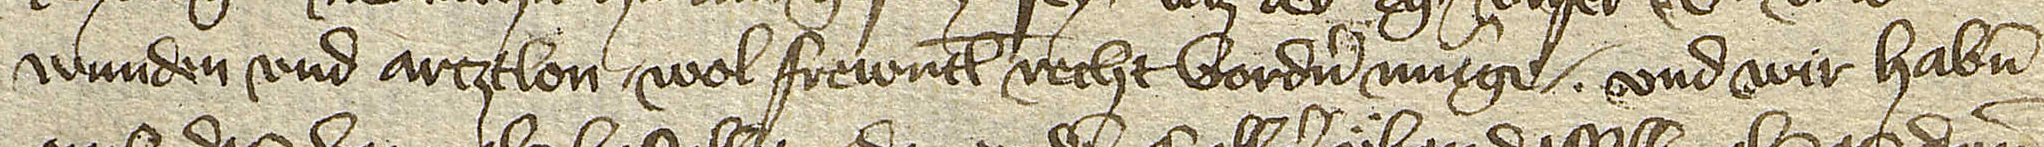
wunden vnd arcʒtlon / wol frewntl* recht vordn* müge / . vnd wir habn*
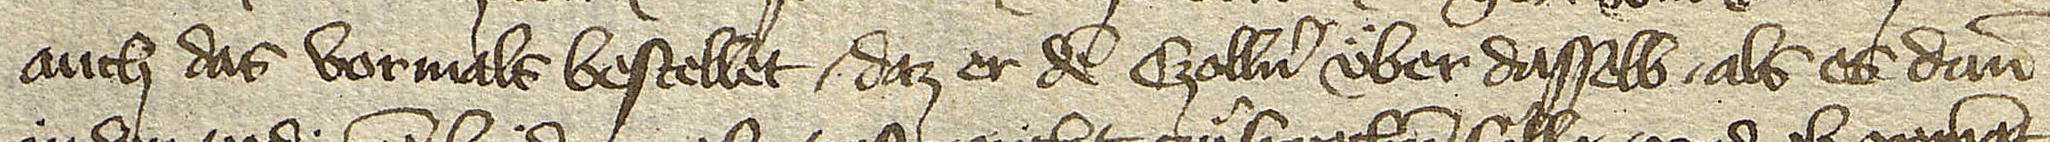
auch das vormals beſtellet / daʒ er d* Cʒolln* v̈ber daſſelb / als es dan*
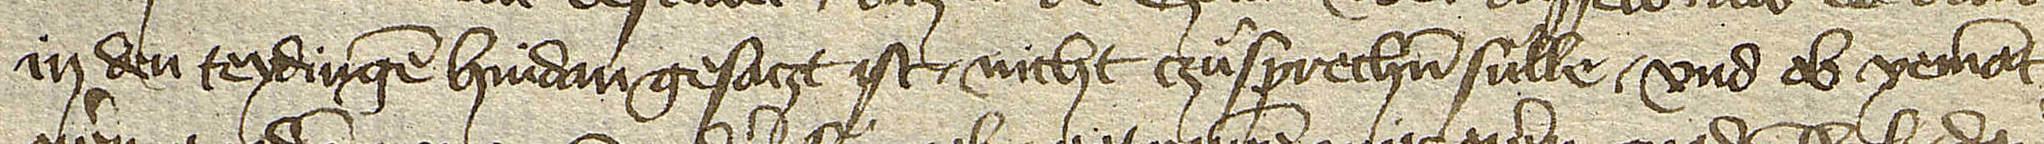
in den teydinge* hindan geſacʒt iſt / nicht cʒü ſprechn* ſülle / vnd ob yemat*
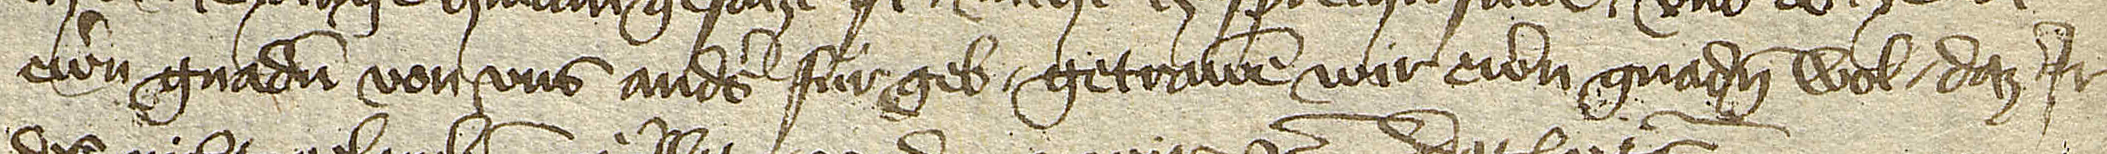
ew*n gnadn* von vns ands* für geb / getrawe* wir ew*n gnadn* wol / daʒ Ir
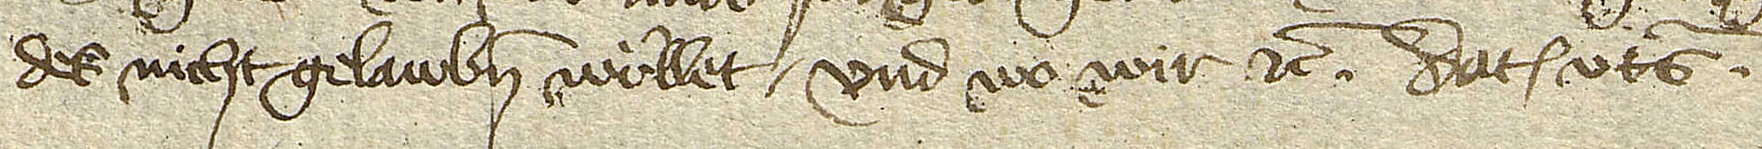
des nicht gelawbn* wöllet / vnd wo wir ec* . Dat* vts* .
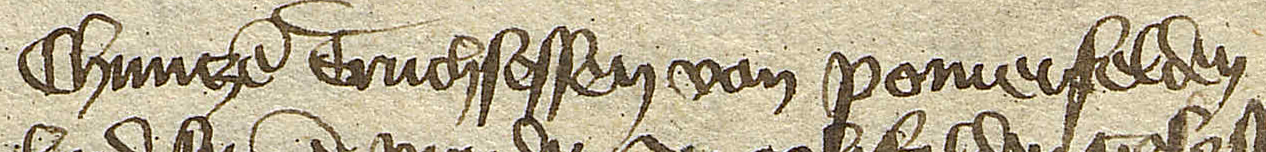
Chuncʒe* Truchſeſſen von pomerfelden
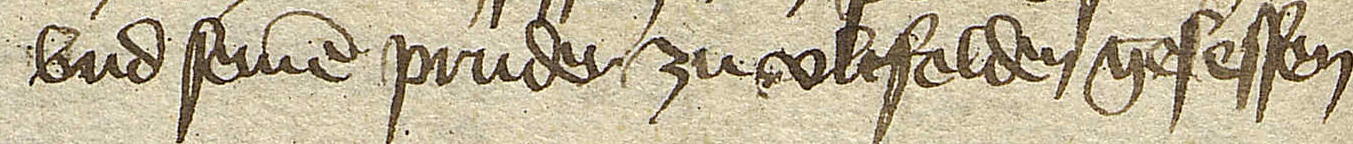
vnd ſeine* pruder ʒu vltfelden geſeſſen
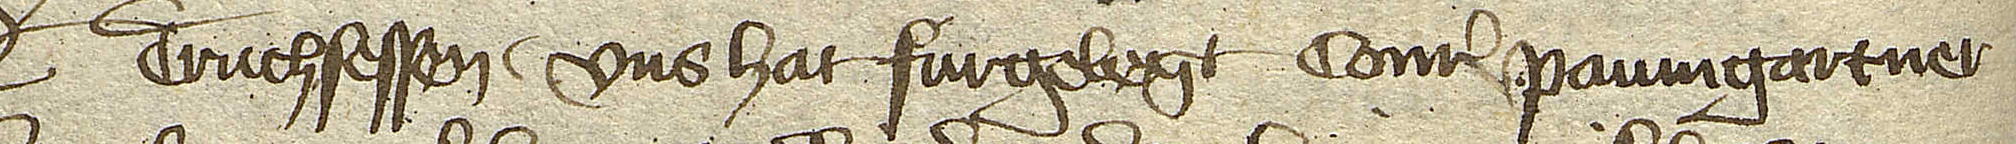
L* Truchſeſſen / vns hat fürgelegt Conr* paumgartner
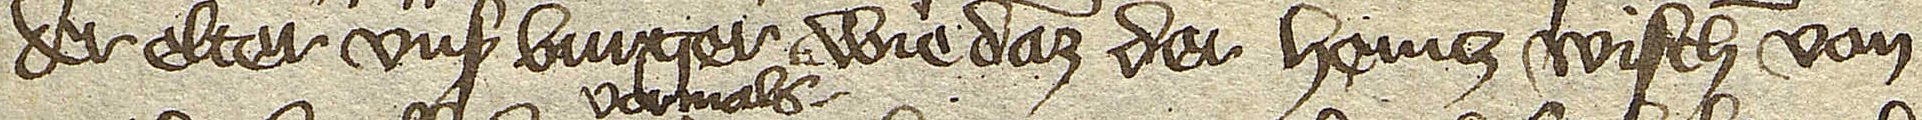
der elter vnſ* burger / wie daʒ der heincʒ wiſch von
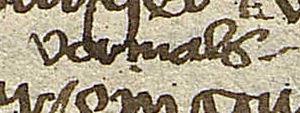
vormals
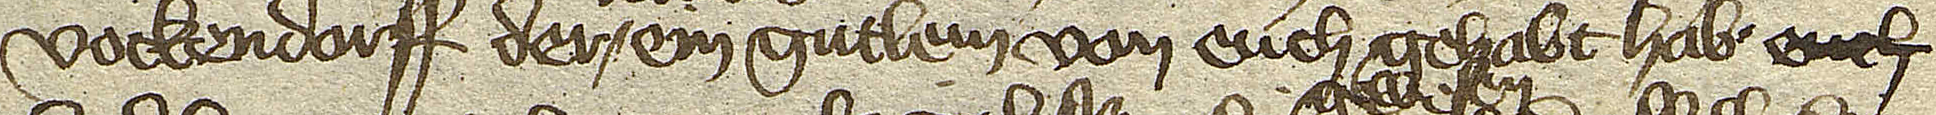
vockendorff der ein gütlein von euch gehabt hab euch
